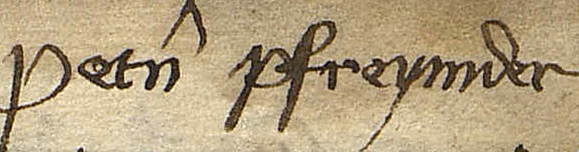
Petn* Pfreymder
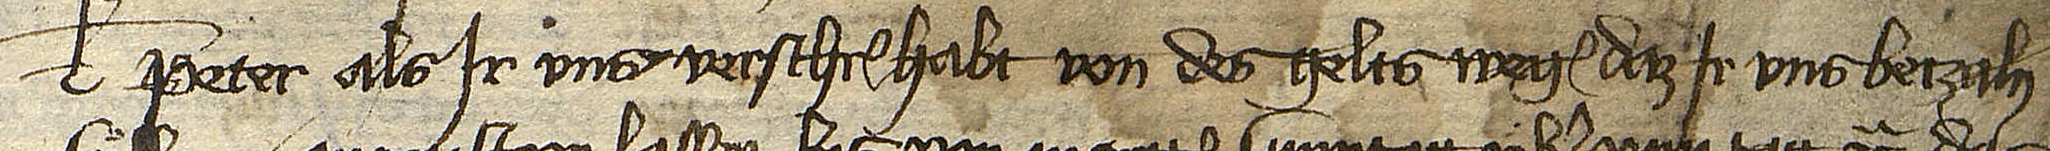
L* Peter als Ir vns verſchr* habt von des gelts weg* daʒ Ir vns becʒaln
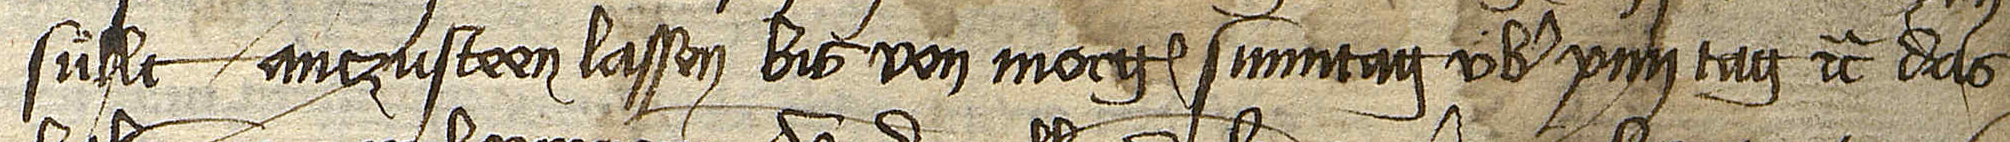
ſüllt / ancʒuſteen laſſen bis von morg* ſunntag v̈b* xiiii tag ec* das
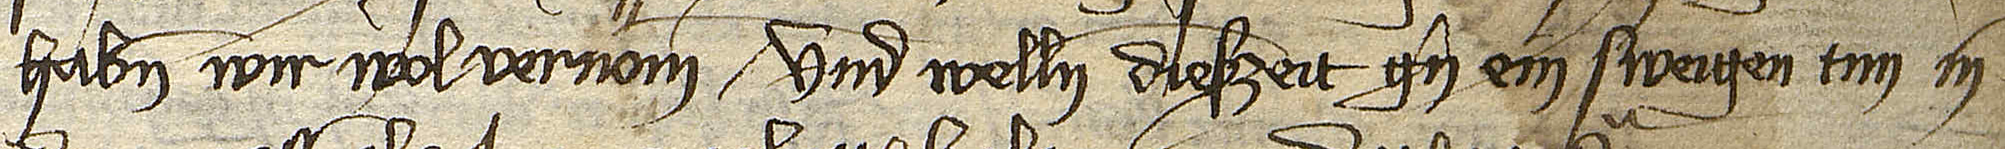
habn* wir wol vernom* / Vnd welln* dieſ*ʒeit gn* ein ſweigen tun in
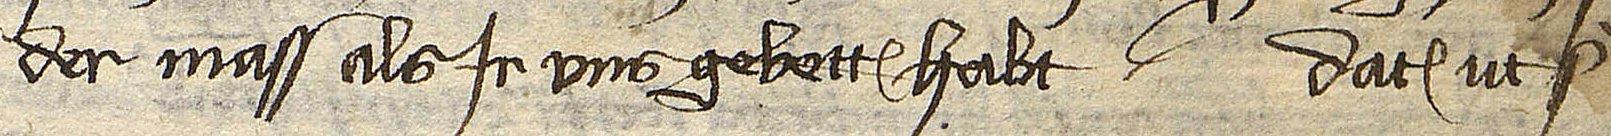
der mass als Ir vns gebett* habt / dat* ut ſ*
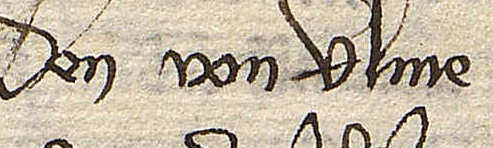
Den von Vlme
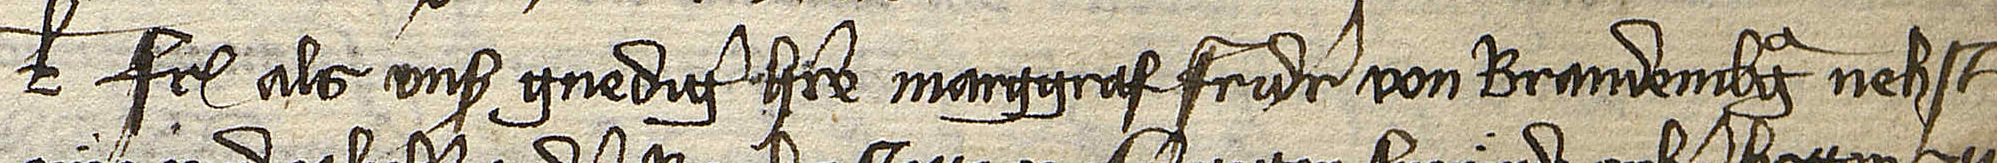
L* fr* als vnſ* gnedig* hr*e marggraf Fridr* von Brandemb*g nehſt
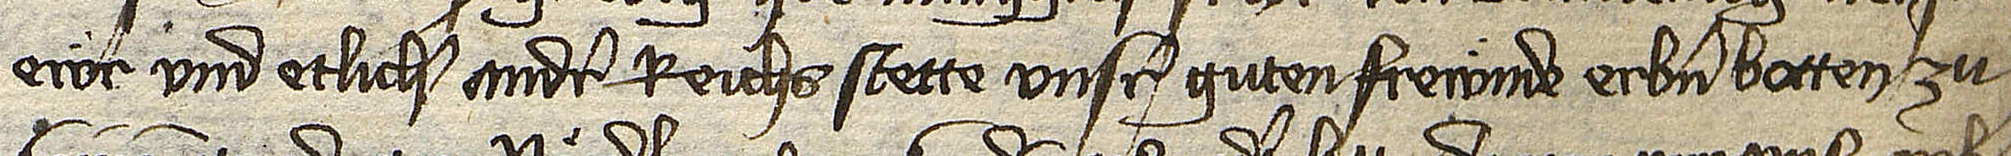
ewr vnd etlich* andr* Reichs ſtette vnſr* guten frewnde erbn* botten ʒu
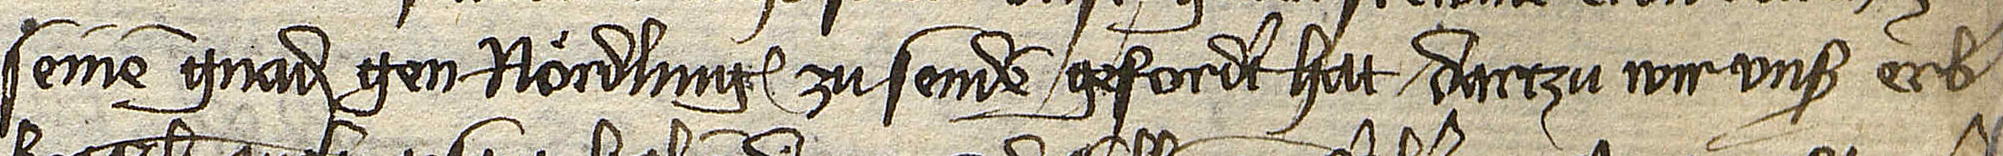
ſeine* gnad* gen Nördling* ʒu ſende* gefordt* hat / darcʒu wir vnſ* erb*
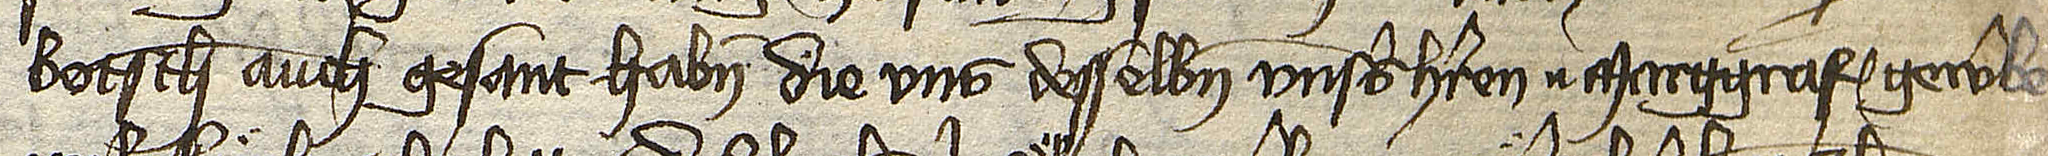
botſch* auch geſant habn* die vns deſſelbn* vnſs* hr*en ~ Marggraf* gew*be
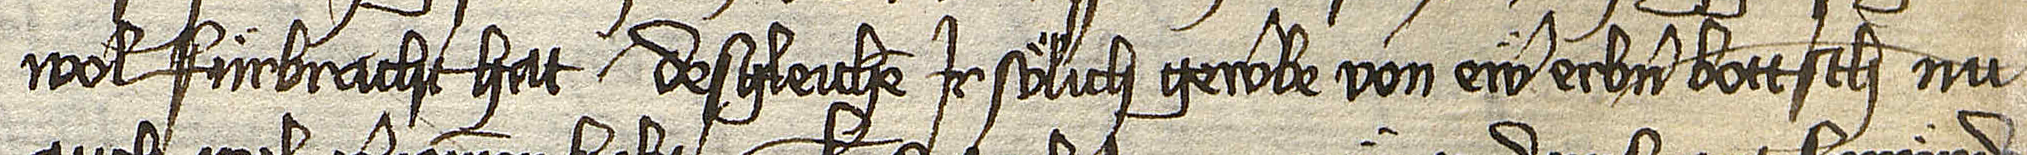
wol fürbracht hat / deſgleiche* Ir ſölich gew*be von ew* erbn* bottſch* nu
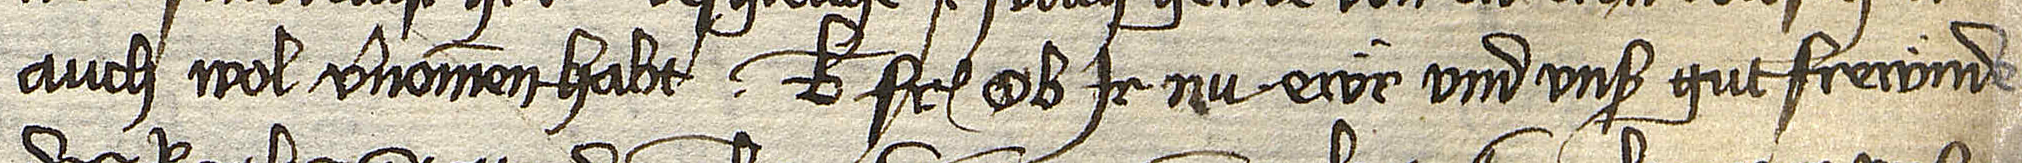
auch wol v*nom*en habt . L* fr* Ob Ir nu ewr vnd vnſ* gut frewnde
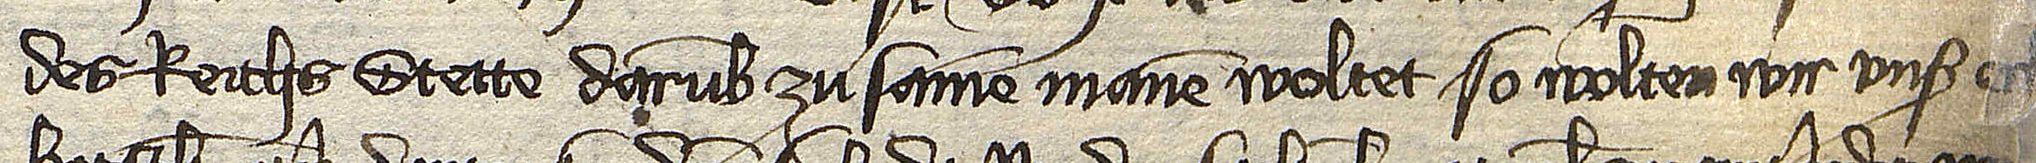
des Reichs Stette darub* ʒu ſame* mane* woltet / ſo wolten wir vnſ* er
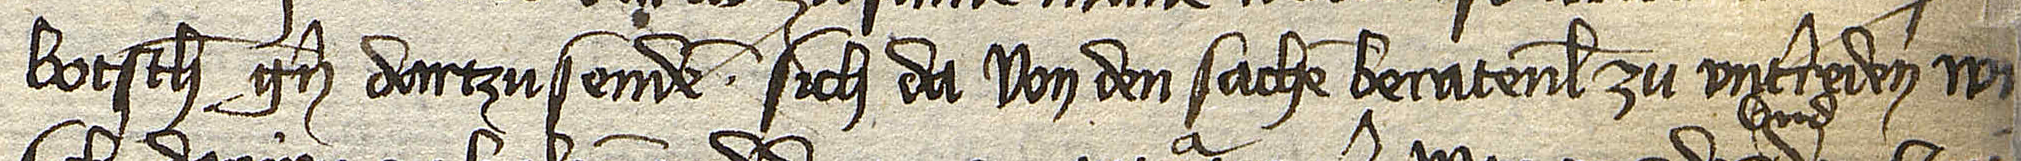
botſch* g*n darcʒu ſende* . ſich da Von den ſache* beratenl* ʒu unt*reden wi
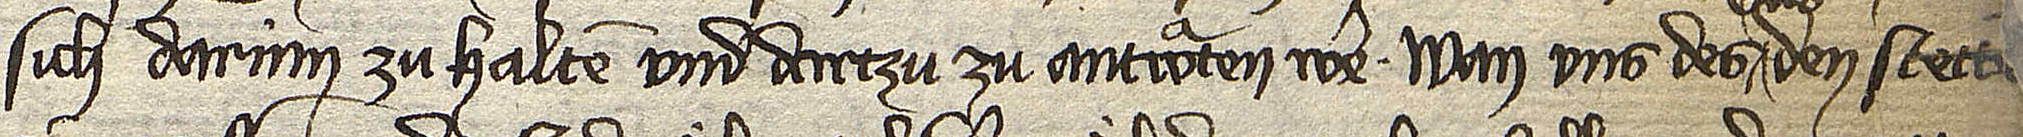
ſich darinn ʒu halte* vnd darcʒu ʒu antw*ten we* . Wan vns des den ſtette*
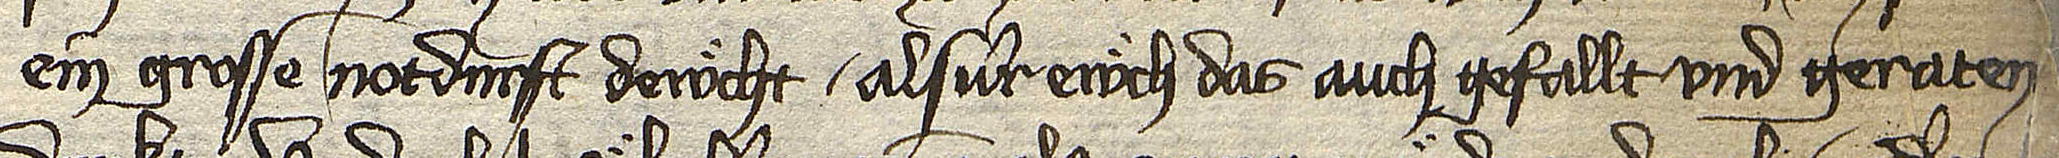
ein groſſe notdurft dewcht / alſu*r ewch das auch gefallt vnd geraten
